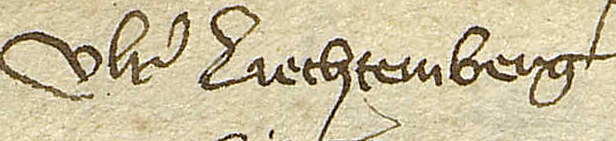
vlr* Liechtemberg*
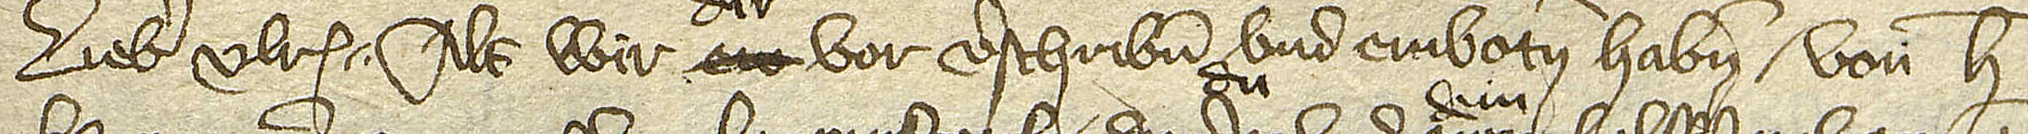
Lieb* vlr* / . Als wir ew vor v*ſchribn* vnd embotn* habn* / von h*
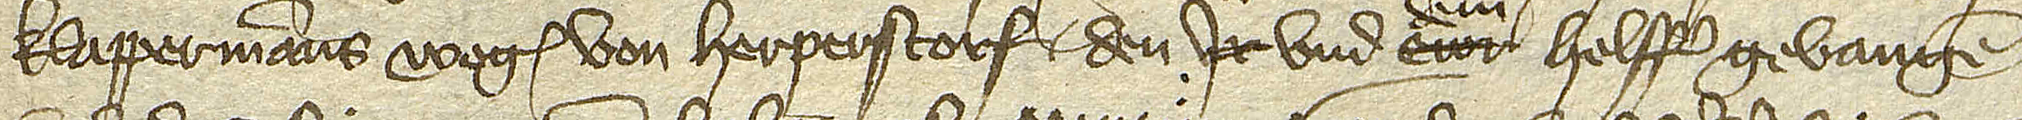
klappermans* weg* von herperſtorf / den Ir vnd ewr helff* gevange*
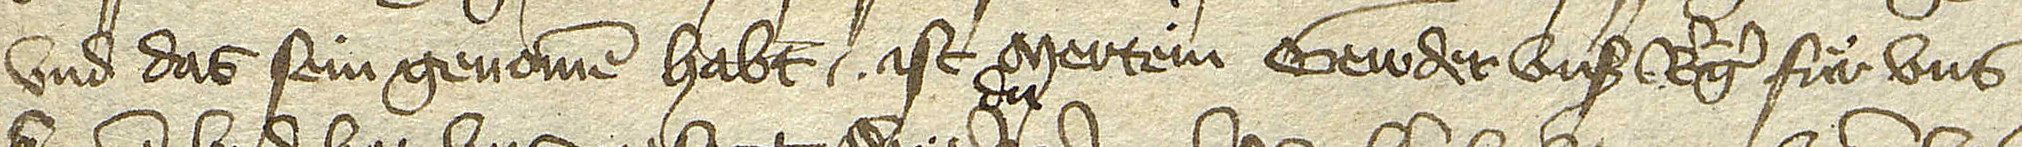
vnd das ſein genome* habt / . iſt Mertein Gewder vnſ* B*g* für vns
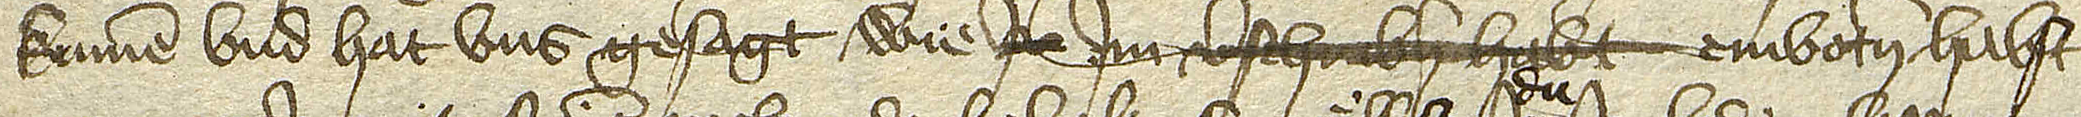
kume* vnd hat vns geſagt / wie Ir Im v*ſchribn* habt embotn* habſt
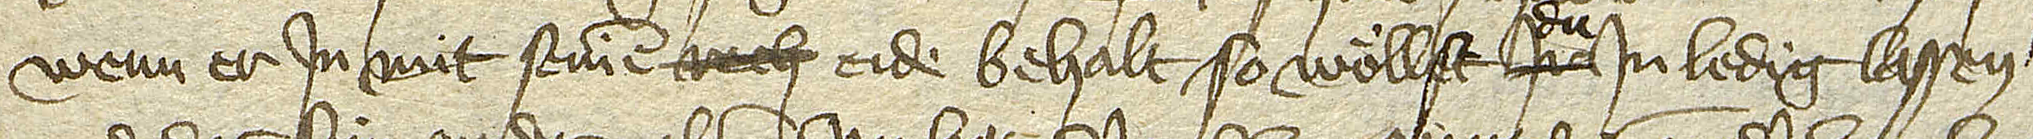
wenn er In mit ſeine* rech eide behalt / ſo wöllſt Ir In ledig laſſen
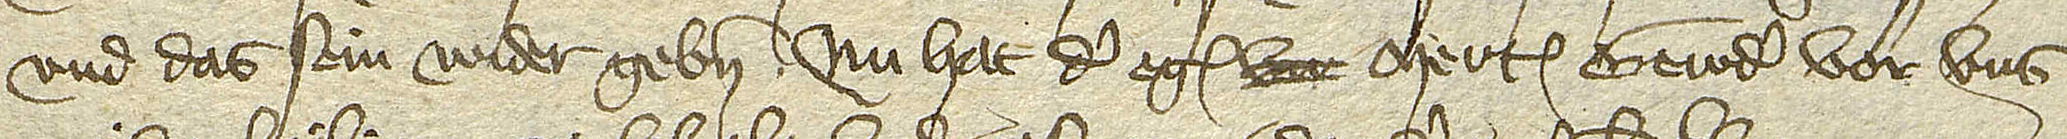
vnd das ſein wider gebn* . Nu hat d* eg* vn Mert* Gewd* vor vns
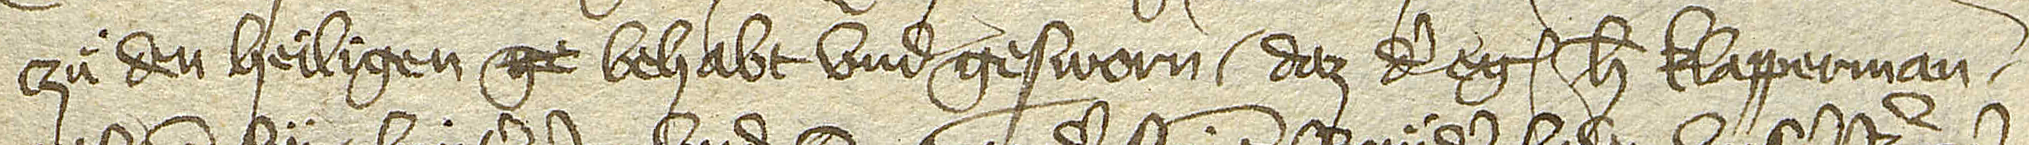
cʒü den heiligen ge behabt vnd geſworn / daʒ d* eg* h* klapperman /
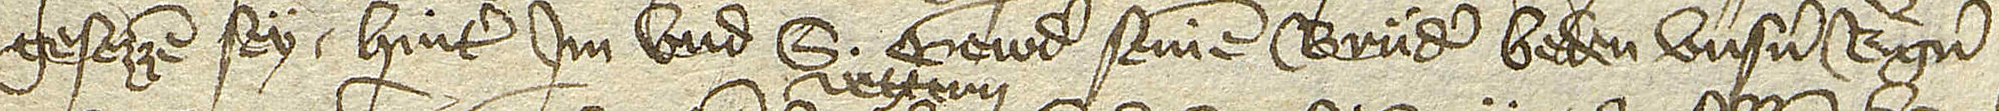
geſeʒʒe* ſey / hint* Im vnd S . Grewd* ſeine* Brüd* beden vnſn* B*gn*
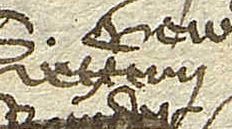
vettern
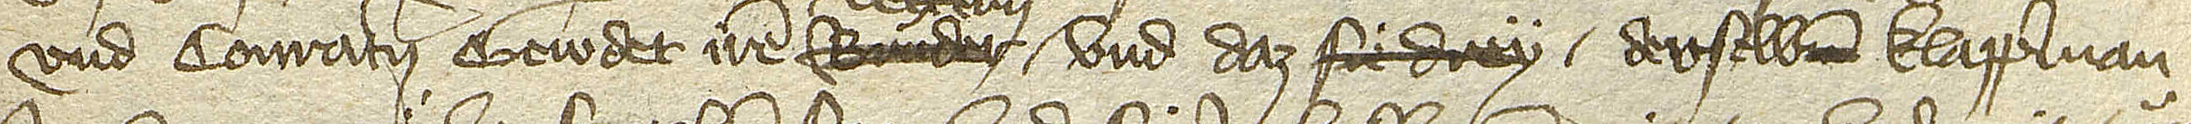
vnd Conratn* Gewder ire* Brüder / vnd daʒ ſie drey / derſelbn* klapp*man
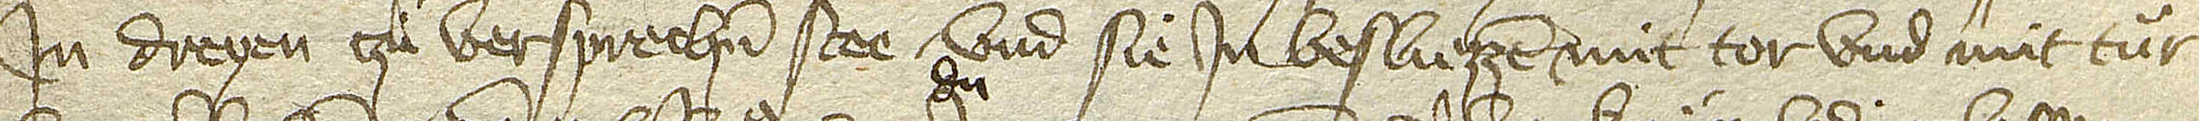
In dreyen cʒü verſprechn* ſtee / vnd ſie In beſlieʒʒe* mit tor vnd mit tür
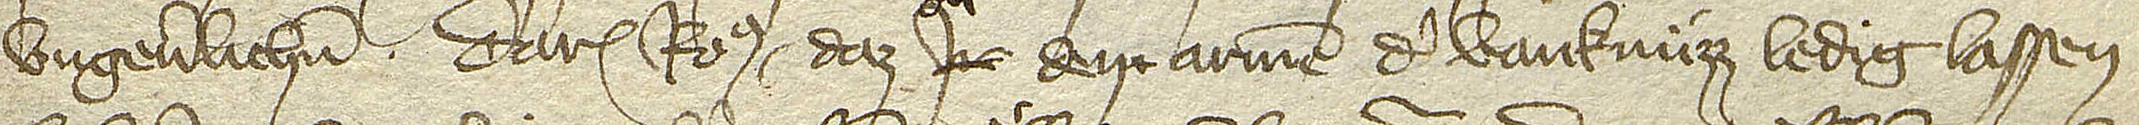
vngeu*lichn* . Dar* Ro* / daʒ Ir den arme* d* vanknüʒʒ ledig laſſen
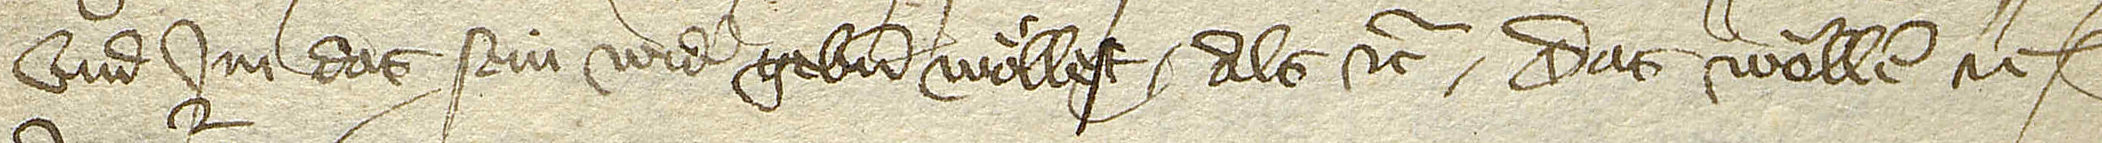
vnd Im das ſein wid* gebn* wöllet / Als ec* / Das wölle* ec*
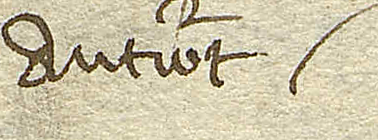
Antwt* /
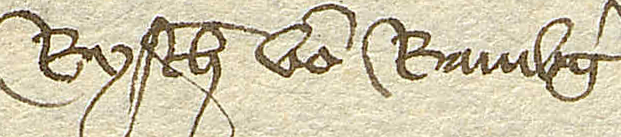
Byſch* vo* Bambg*
